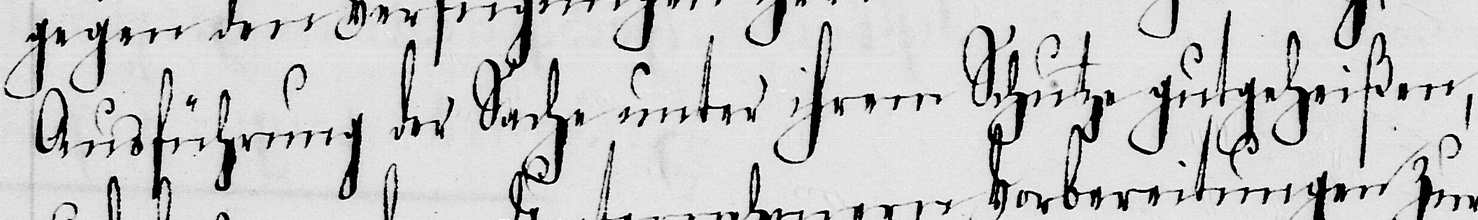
Ausführung der Sache unter ihrem Schutze gutgeheißen,
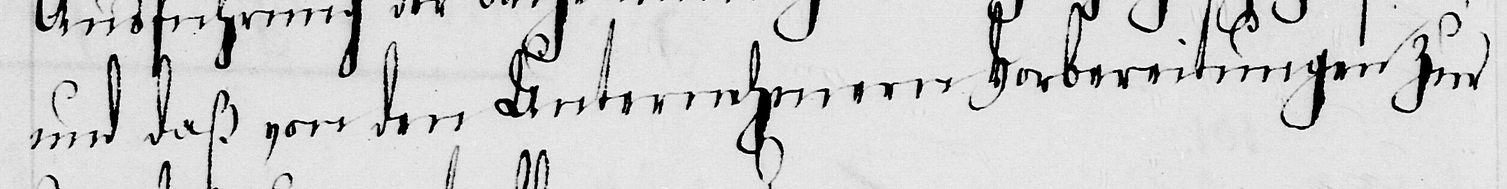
und daß von den Unternehmen Vorbereitungen zur
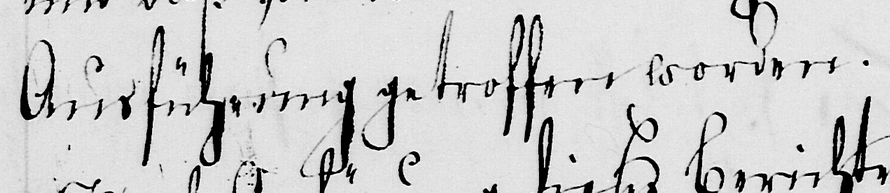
Ausführung getroffen worden.
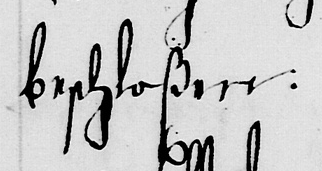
beschloßen:
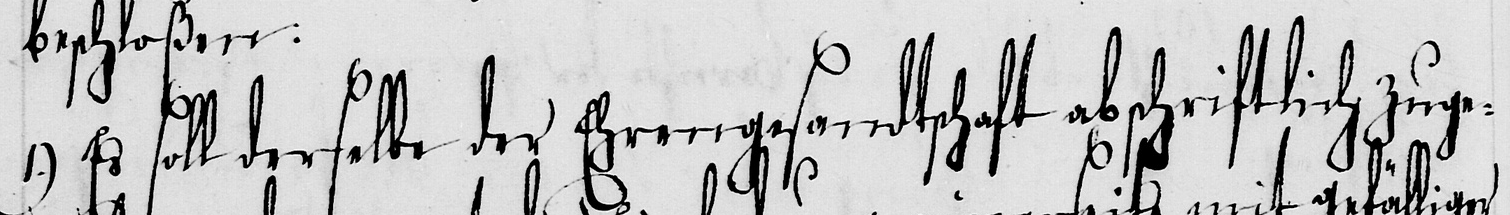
soll derselbe der Ehrengesandtschaft abschri¬
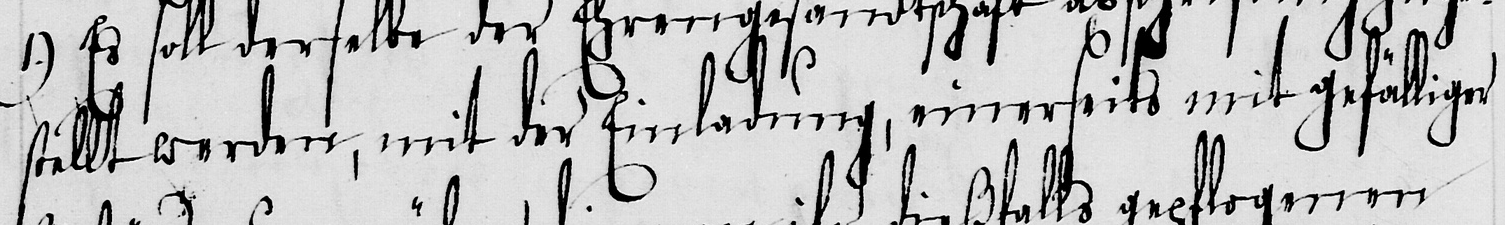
stellt werden, mit der Einladung, einerseits mit gefälliger
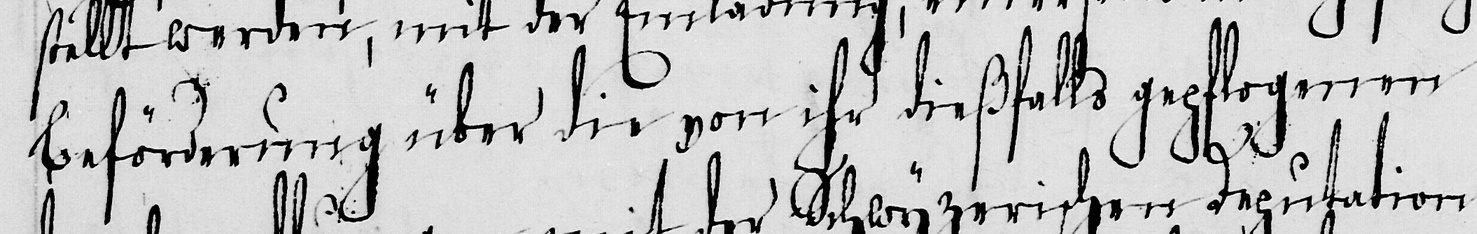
Beförderung über die von ihr dießfalls gepflogenen
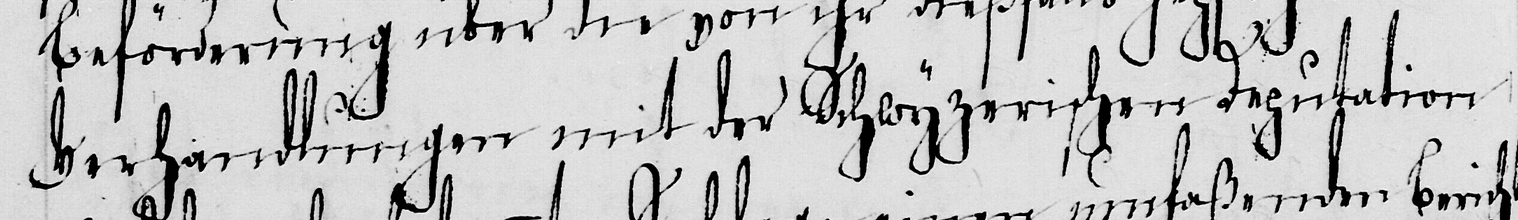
Verhandlungen mit der Schwyzerischen Deputation
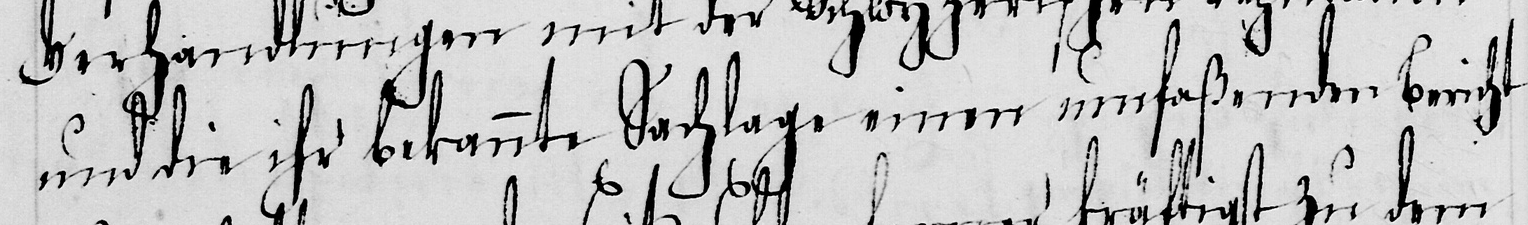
und die ihr bekannte Sachlage einen umfaßenden Bericht
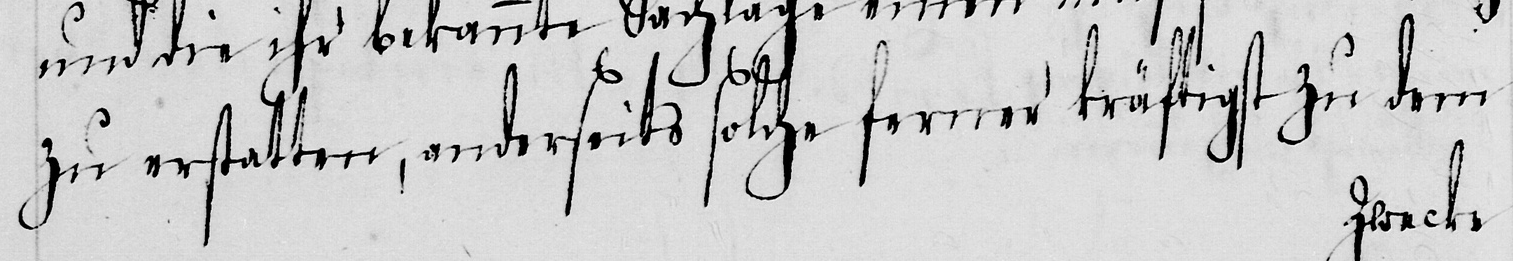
zu erstatten, anderseits solche ferner kräftigst zu dem
